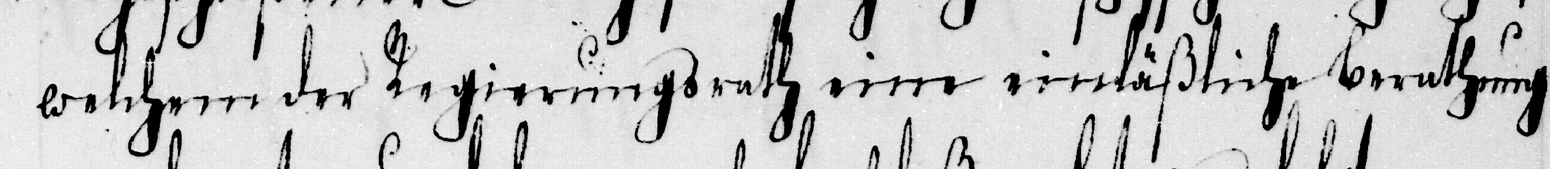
welchem der Regierungsrath eine einläßliche Berathung
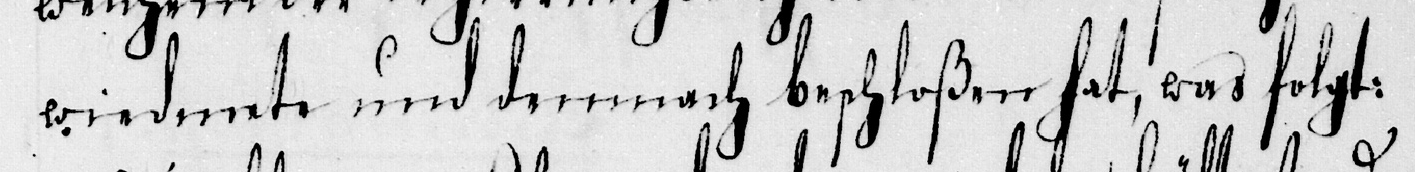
wiedmete und demnach beschloßen hat, was folgt:
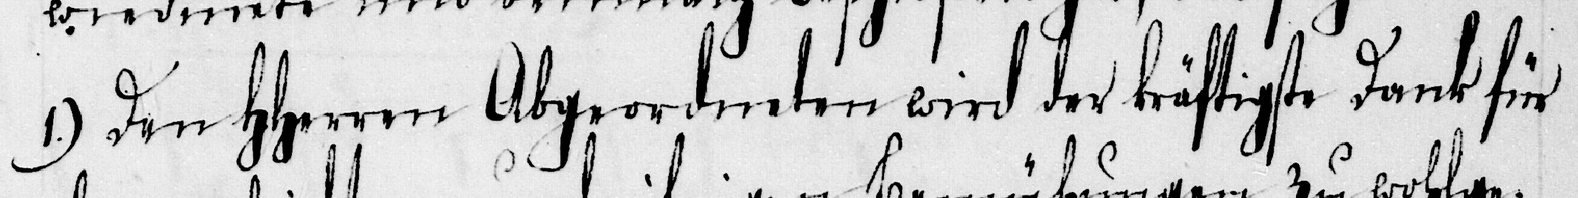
1.) Den HHerren Abgeordneten wird der kräftigste Dank für
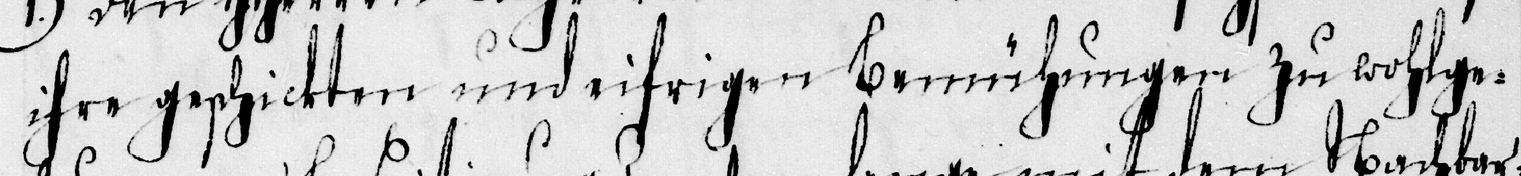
ihre geschickten und eifrigen Bemühungen zu wohlge¬
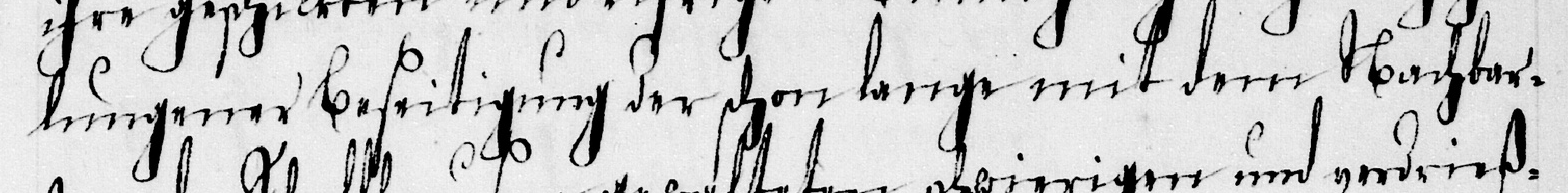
lungener Beseitigung der schon lange mit dem Nachbar¬
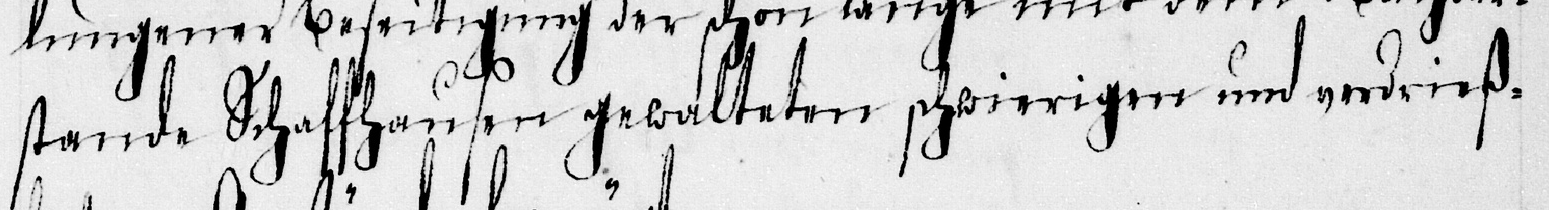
stande Schaffhausen gewalteten schwierigen und verdrieß¬
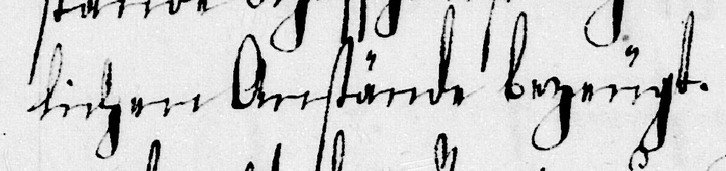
lichen Anstände bezeugt.
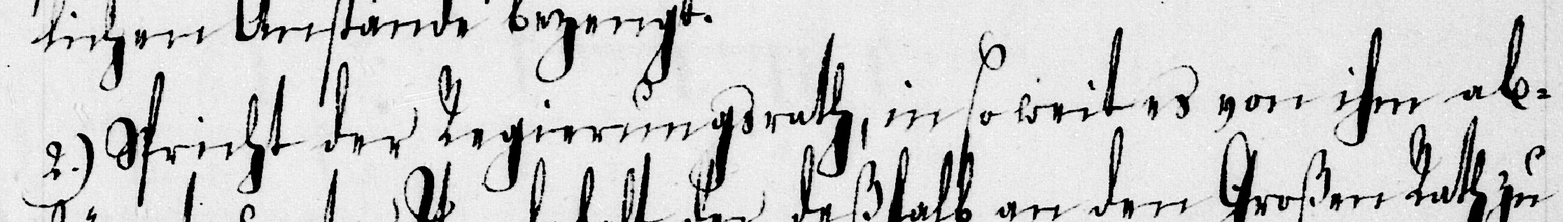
2.) Spricht der Regierungsrath, in so weit es von ihm ab¬
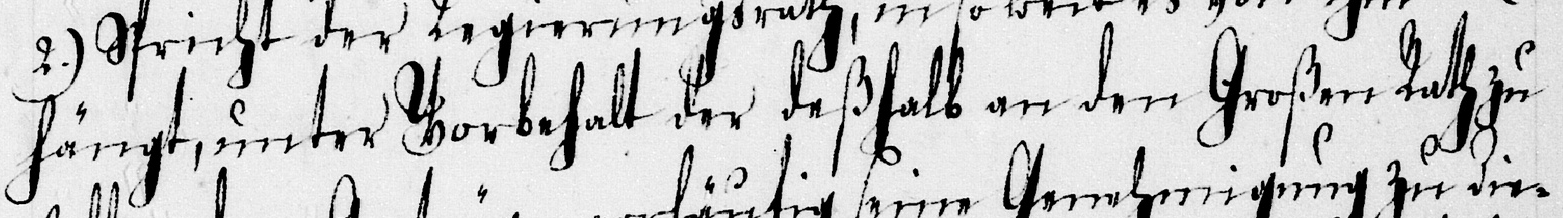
hängt, unter Vorbehalt der deßhalb an den Großen Rath zu
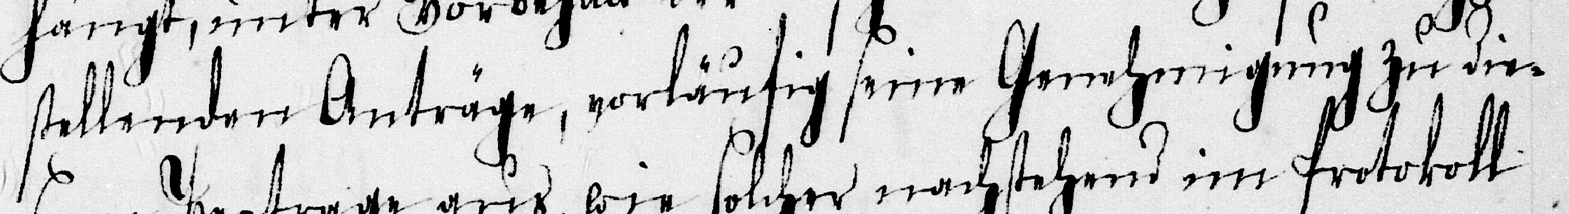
stellenden Anträge, vorläufig seine Genehmigung zu die¬
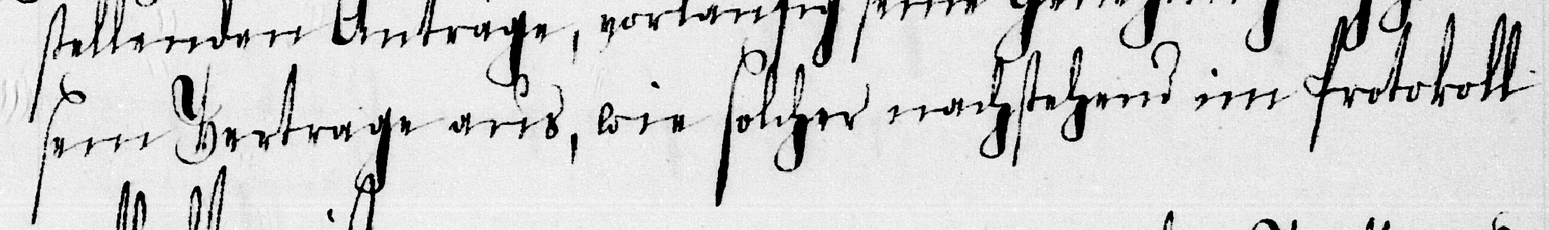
sem Vertrage aus, wie solcher nachstehend im Protokoll
